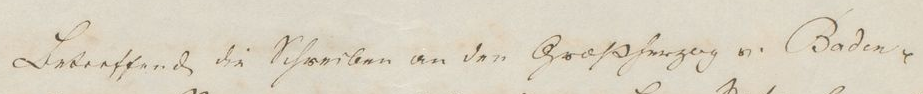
Betreffend die Schreiben an den Großherzog v. Baden &
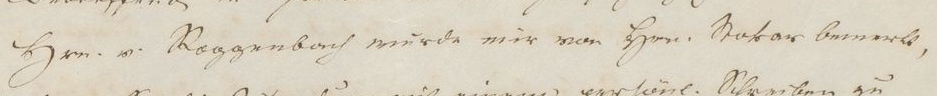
Hrn. v. Roggenbach wurde mir von Hrn. Stokar bemerkt,
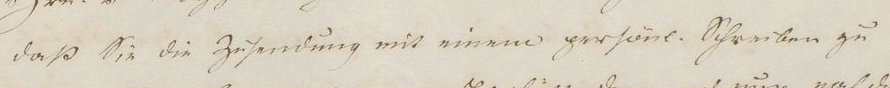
daß Sie die Zusendung mit einem persönl. Schreiben zu
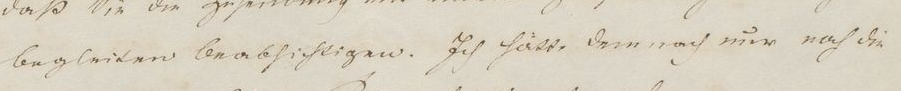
begleiten beabsichtigen. Ich hätte demnach nur noch die
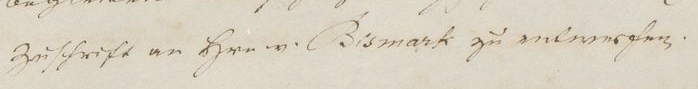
Zuschrift an Hrn v. Bismark zu entwerfen. –
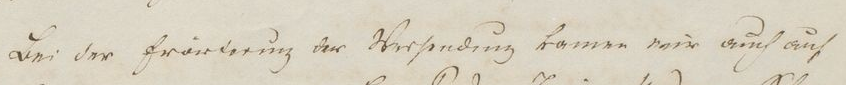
Bei der Erörterung der Versendung kamen wir auch auf
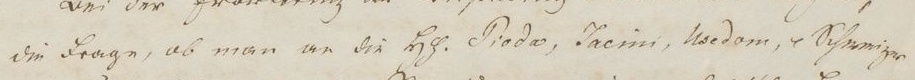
die Frage, ob man an die Hh. Pioda, Jacini, Usedom & Schweizer
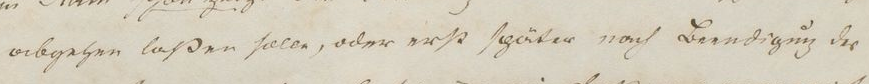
abgehen laßen solle, oder erst später nach Beendigung der
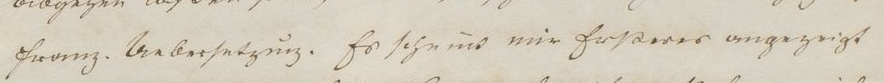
franz. Uebersetzung. Es scheint mir Ersteres angezeigt
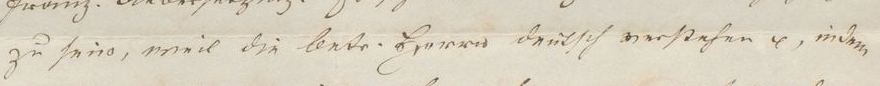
zu sein, weil die betr. Herren deutsch verstehen &, indem
